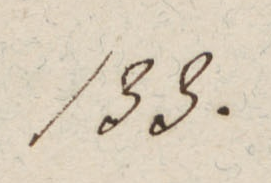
133.
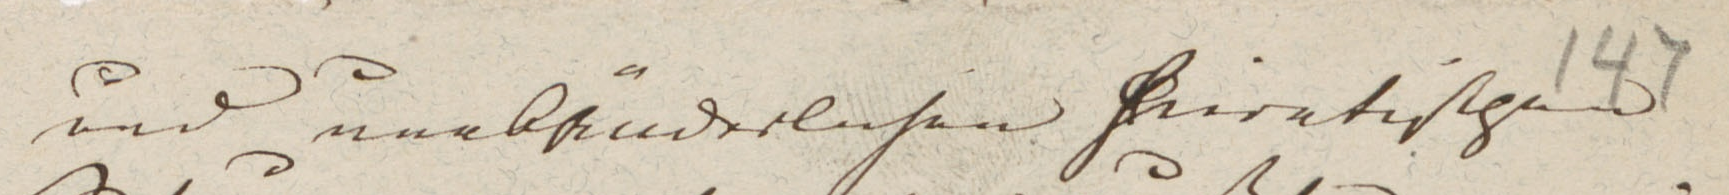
und unabänderlichen Hhieratischen
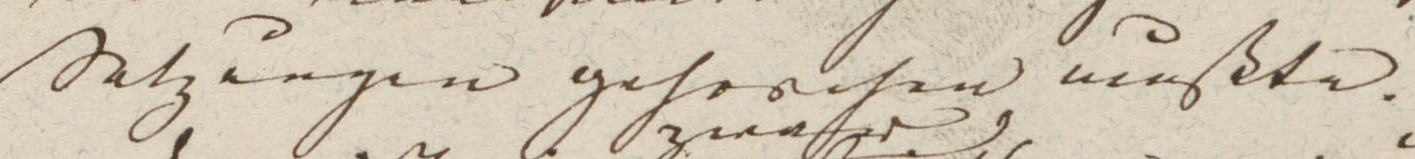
Satzungen gehorchen musste.
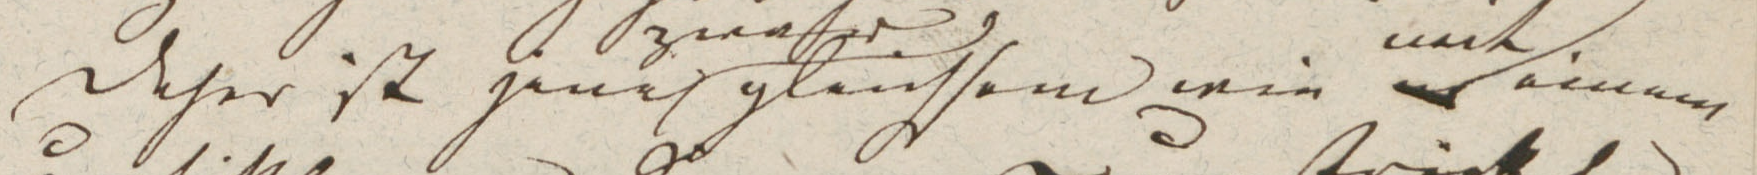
Daher ist jene zwar gleichsam wie mit einem
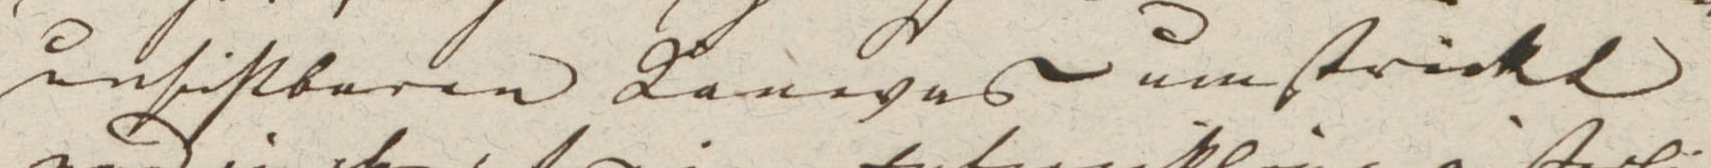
unsichtbaren Kanevas umstrickt
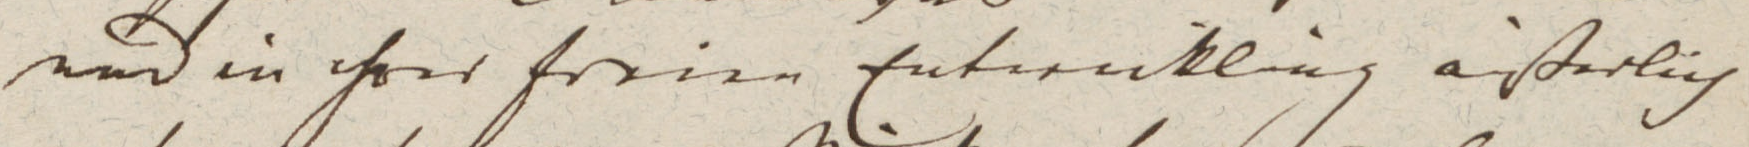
und in ihrer freien Entwicklung äusserlich
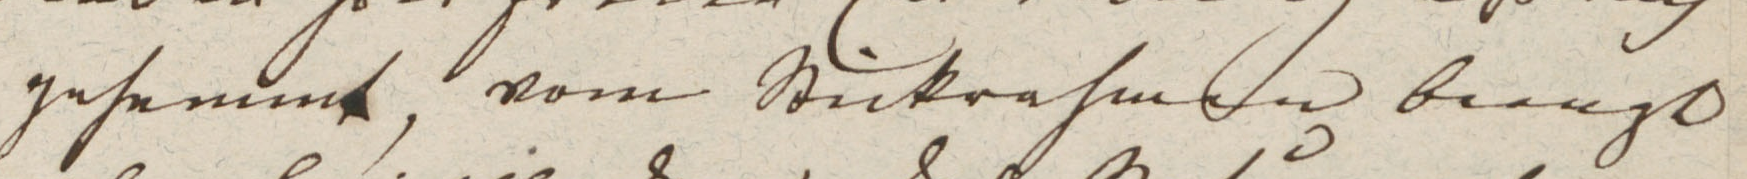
gehemmt, vom Stickrahmen beengt
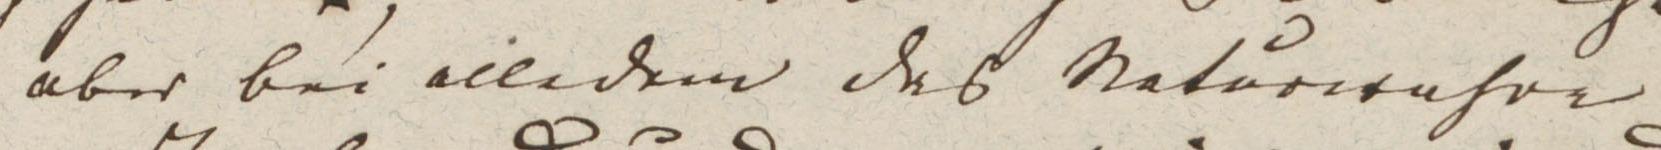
aber bei alledem das Naturwahre
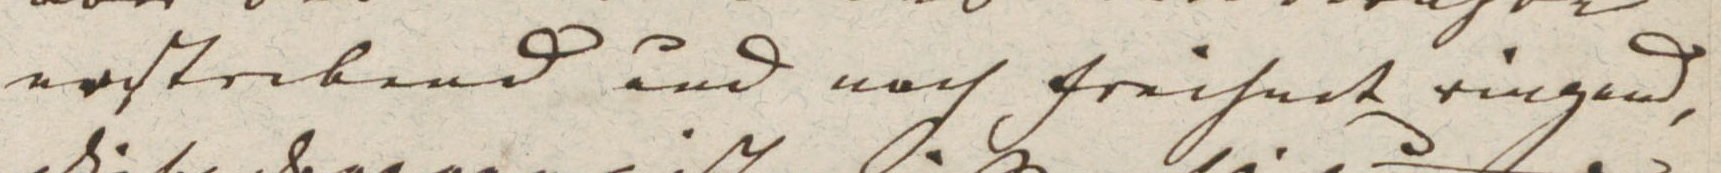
estrebend und nach Freiheit ringend,
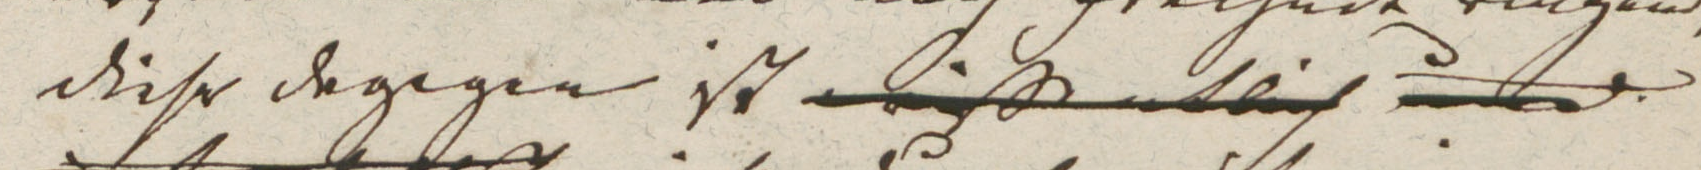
dies dagegen ist wissentlich und
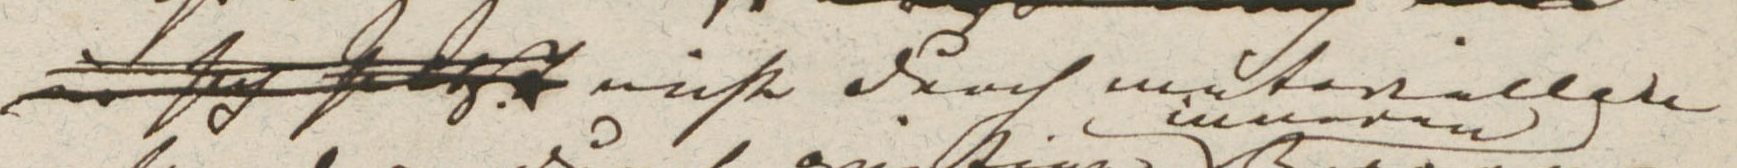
in sich selbst nicht durch materiellen
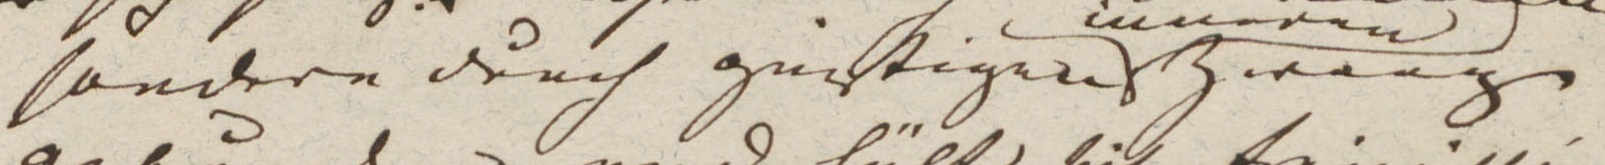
sondern durch geistigen inneren Zwang
